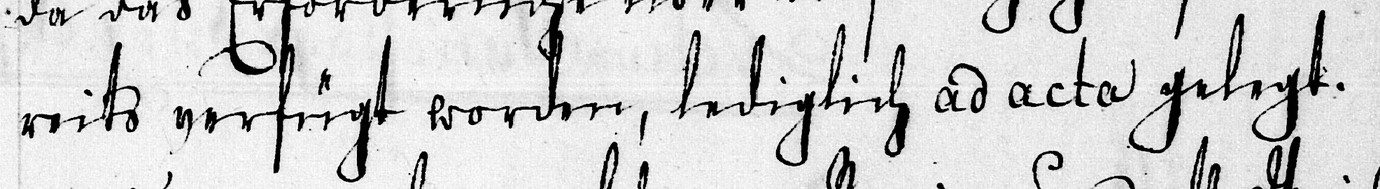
reits verfügt worden, lediglich ad acta gelegt.
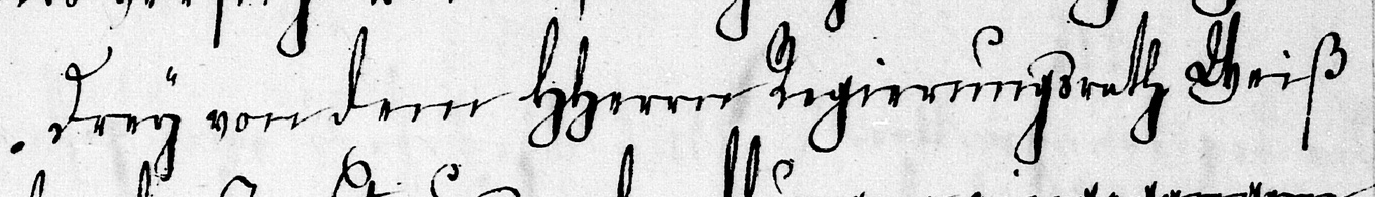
Drey von dem HHerrn Regierungsrath Weiß
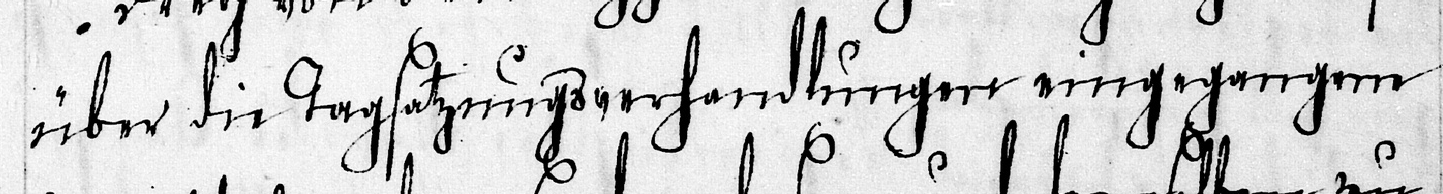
über die Tagsatzungsverhandlungen eingegangene
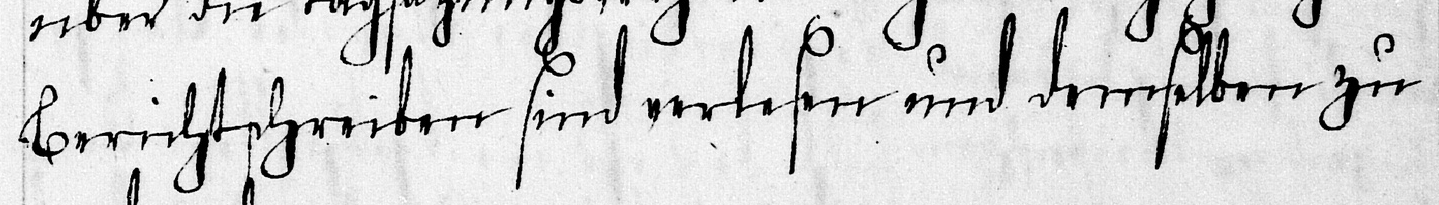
Berichtschreiben sind verlesen und demselben zu
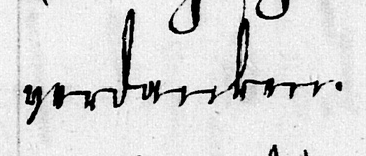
verdanken.
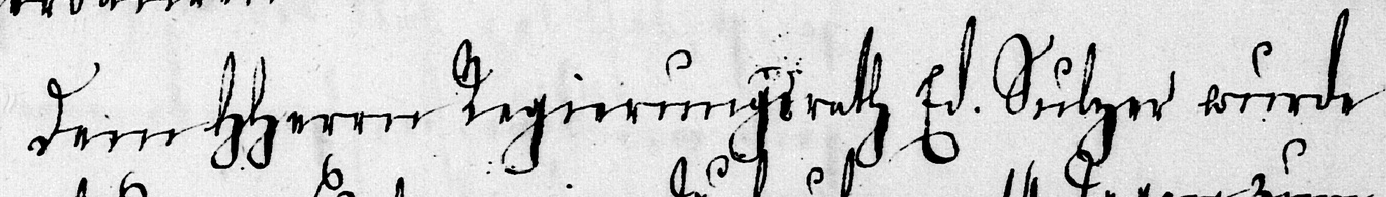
Dem HHerrn Regierungsrath Ed. Sulzer wurde
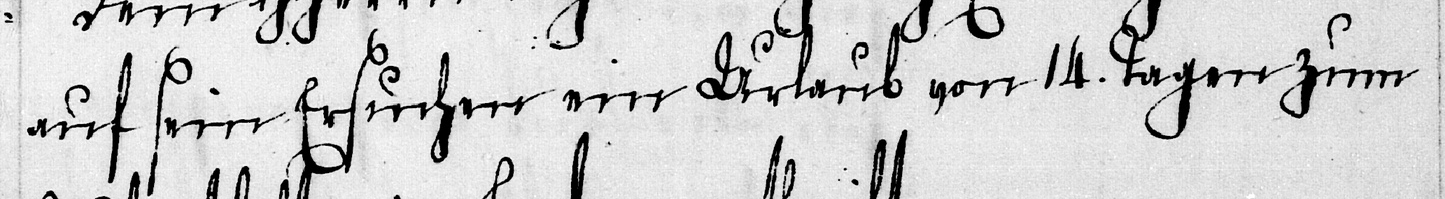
auf sein Ersuchen ein Urlaub von 14. Tagen zum
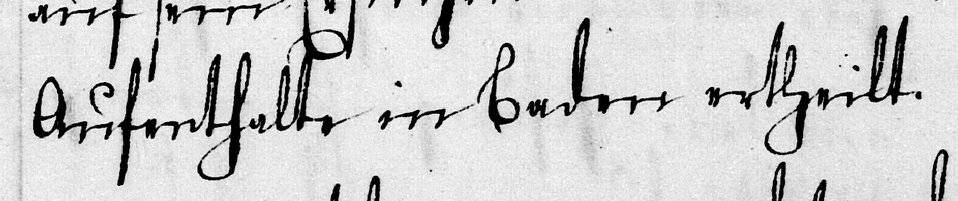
Aufenthalte in Baden ertheilt.
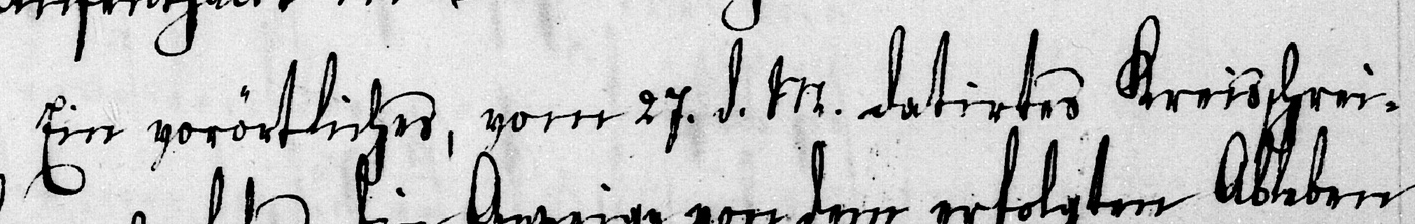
Ein vorörtliches, vom 27. d. M. datirtes Kreisschrei¬
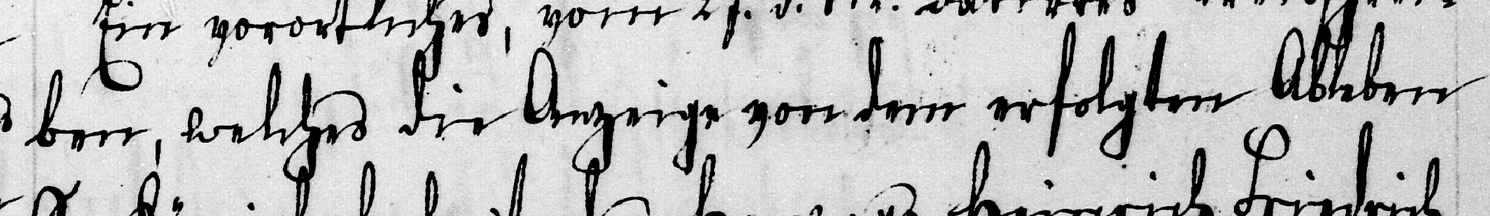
ben, welches die Anzeige von dem erfolgten Ableben
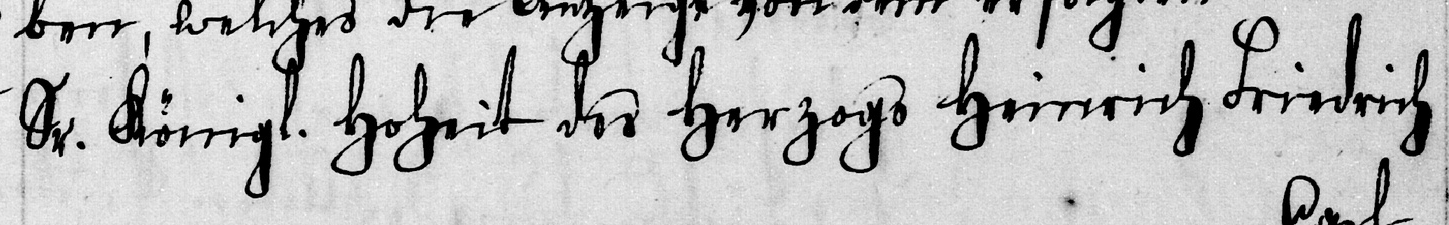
Sr. Königl. Hoheit des Herzogs Heinrich Friedrich
